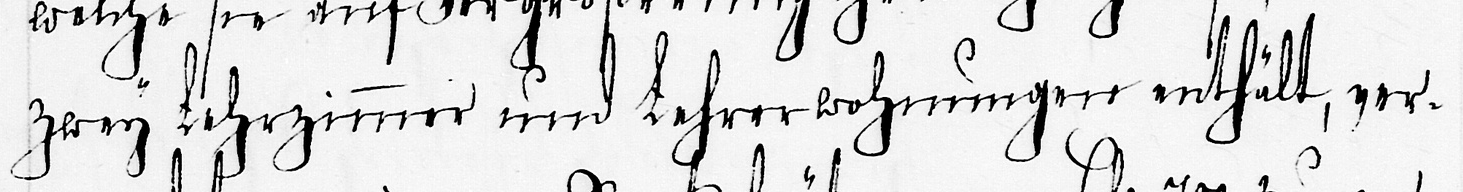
zwey Lehrzimmer und Lehrerwohnungen enthält, ver¬
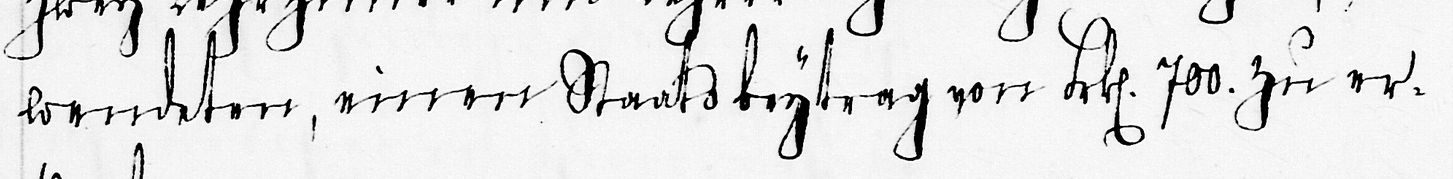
wendeten, einen Staatsbeytrag von Frk[en]. 700. zu er¬
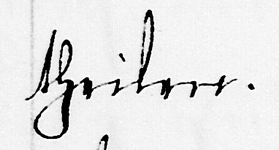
theilen.
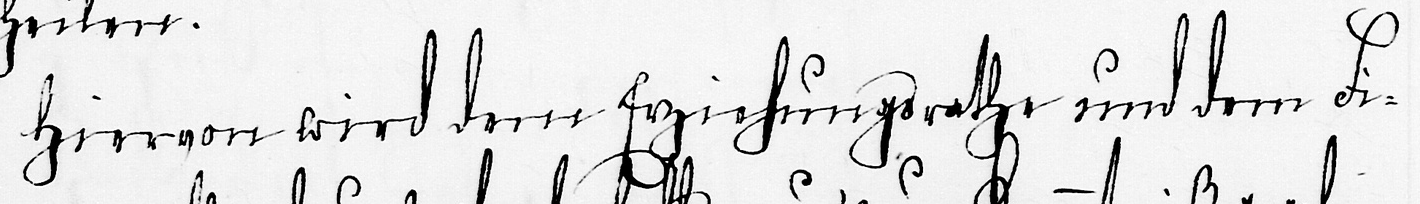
Hiervon wird dem Erziehungsrathe und dem Fi¬
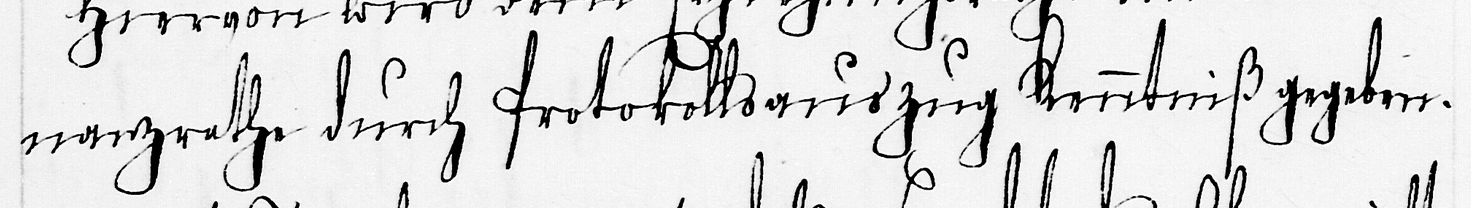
nanzrathe durch Protokollsauszug Kenntniß gegeben.
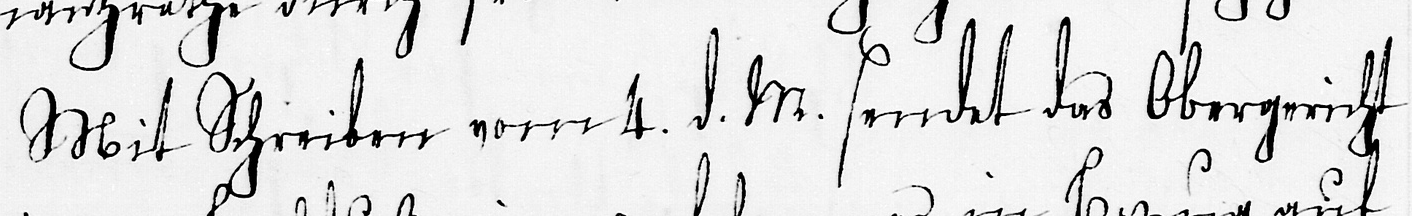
Mit Schreiben vom 4. d. M. sendet das Obergericht
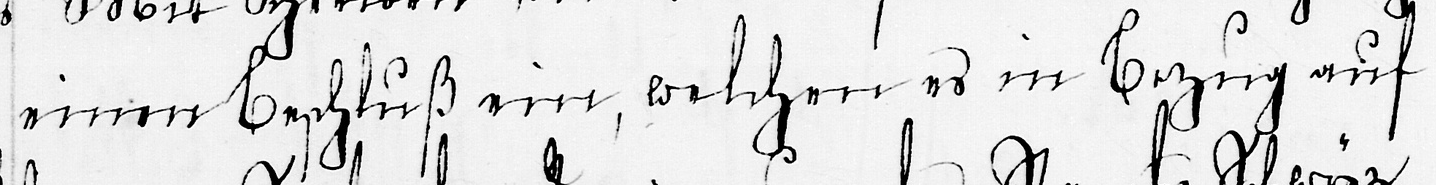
einen Beschluß ein, welchen es in Bezug auf
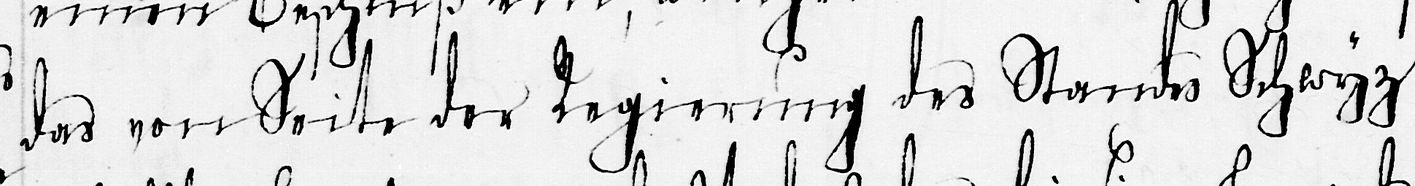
das von Seite der Regierung des Standes Schwyz
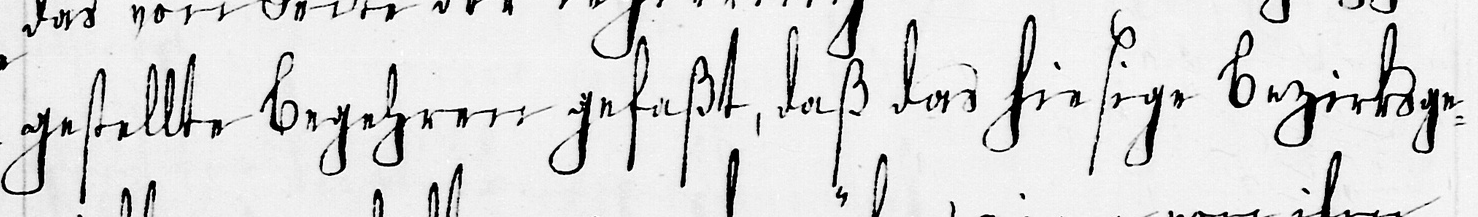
gestellte Begehren gefaßt, daß das hiesige Bezirksge¬
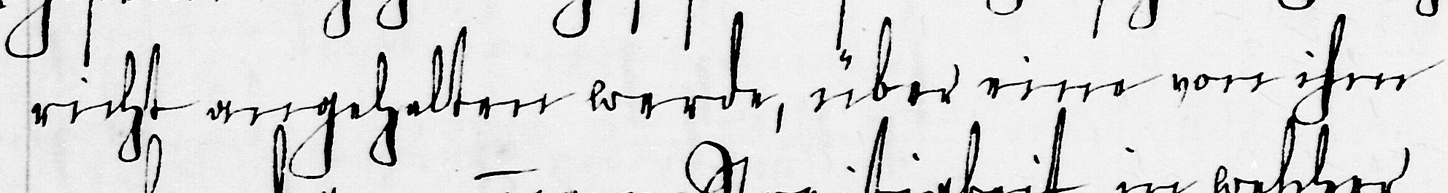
richt angehalten werde, über eine von ihm
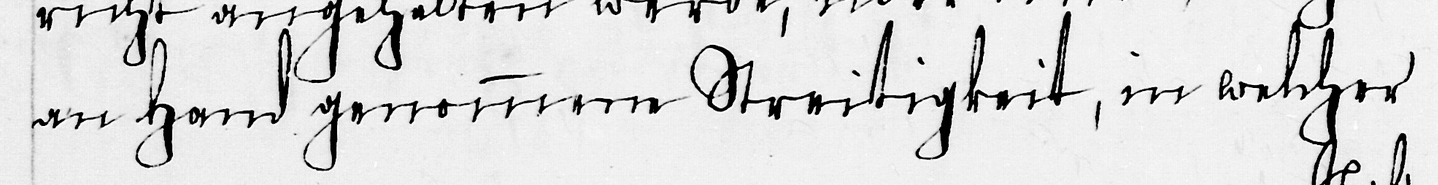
an Hand genommene Streitigkeit, in welcher
